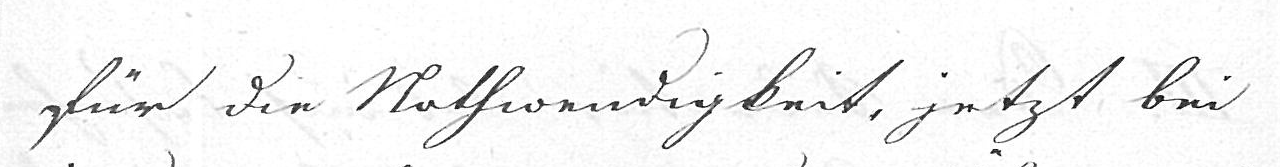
für die Nothwendigkeit, jetzt bei
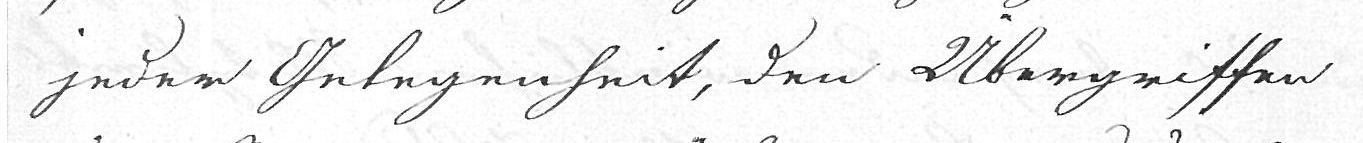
jeder Gelegenheit, den Übergriffen
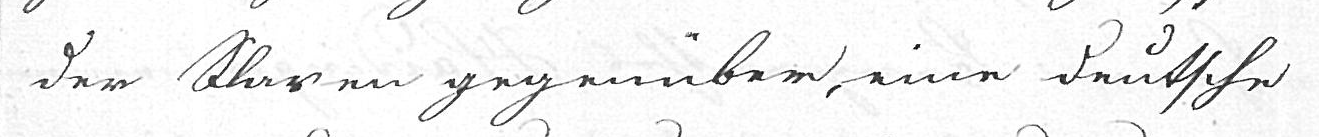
der Slaven gegenüber, eine deutsche
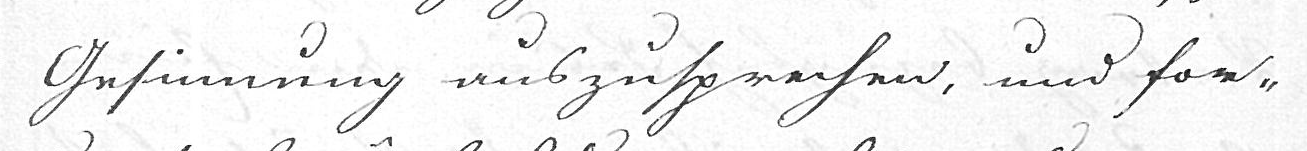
Gesinnung auszusprechen, und fort-
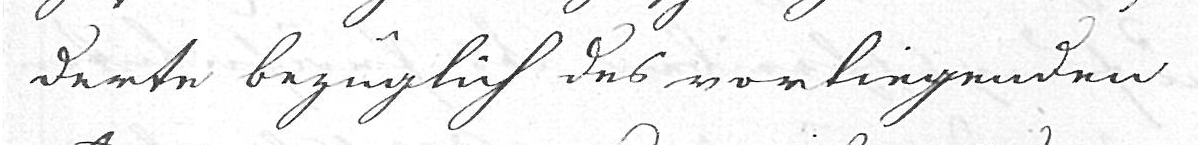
derte bezüglich des vorliegenden
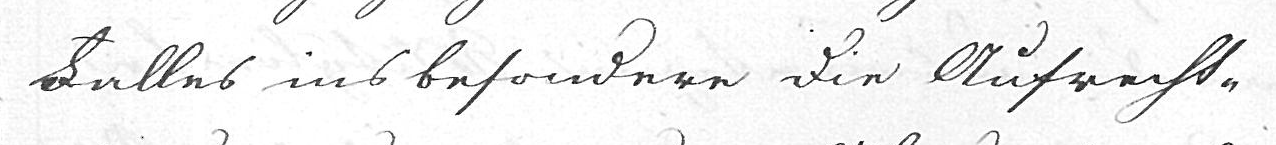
Falles insbesondere die Aufrecht-
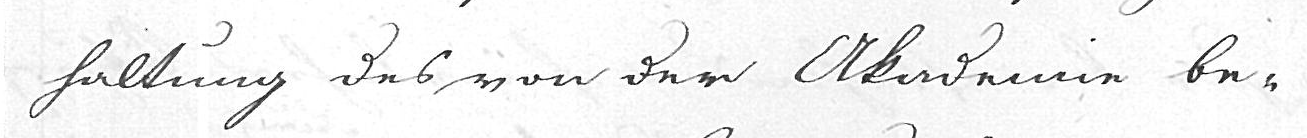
haltung des von der Akademie be-
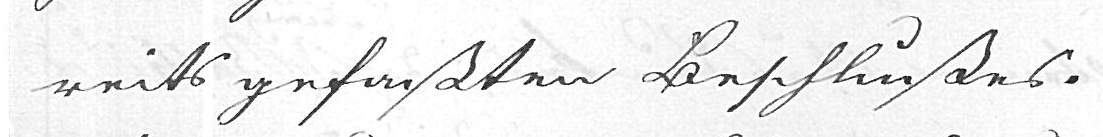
reits gefaßten Beschlusses
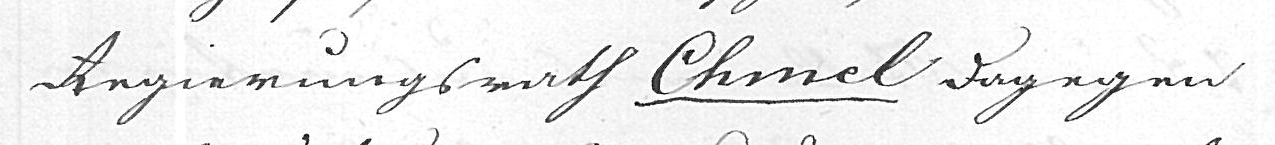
Regierungsrath Chmel dagegen
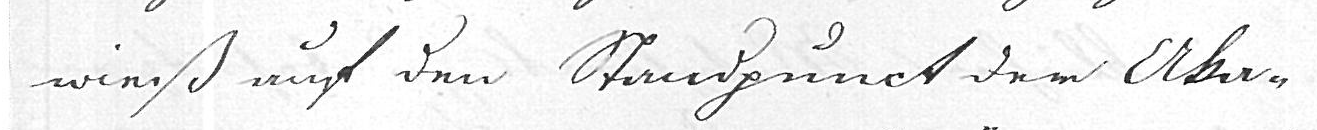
wieß auf den Standpunct der Aka-
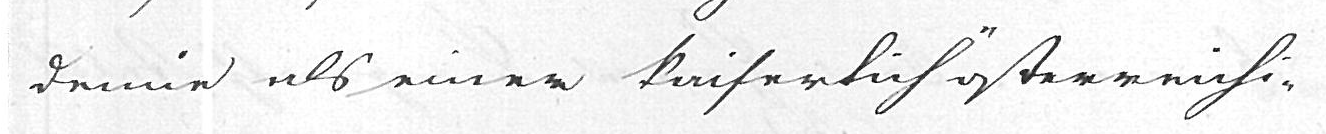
demie als einer kaiserlich österreichi-
